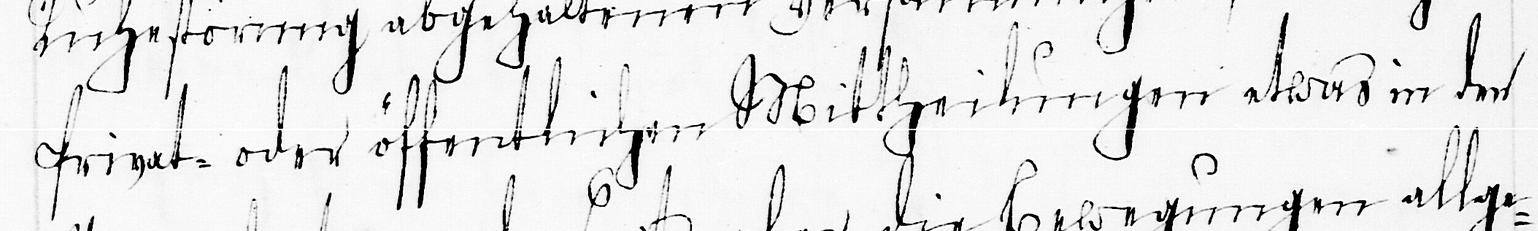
Privat- oder öffentlichen Mittheilungen etwas in den
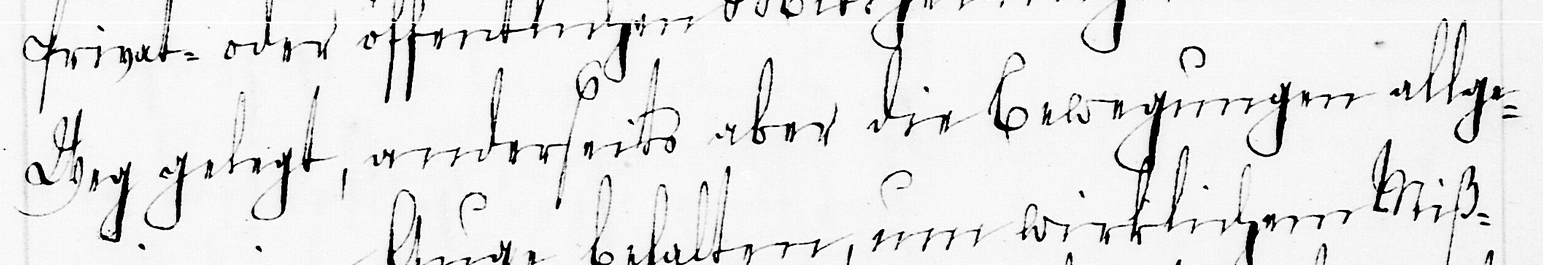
Weg gelegt, anderseits aber die Bewegungen allge¬
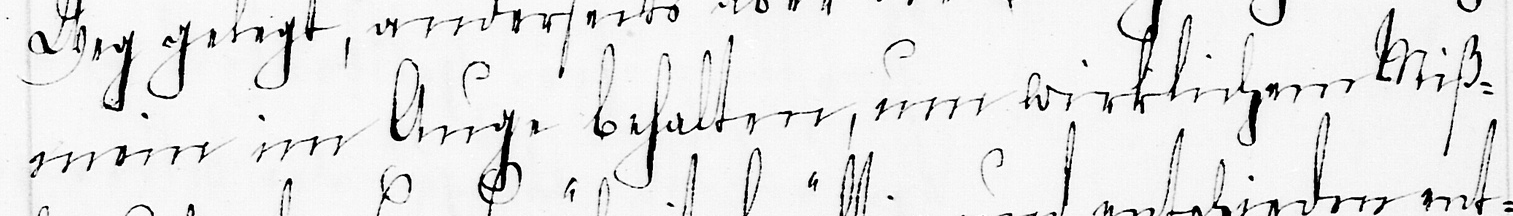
mein im Auge behalten, um wirklichem Miß¬
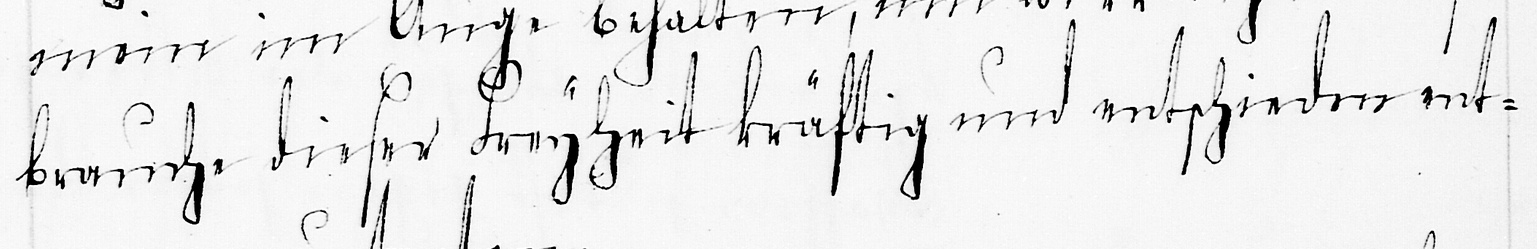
brauche dieser Freyheit kräftig und entschieden ent¬
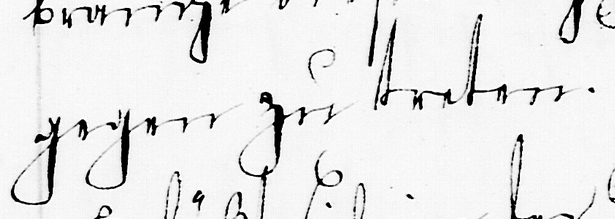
gegen zu treten.
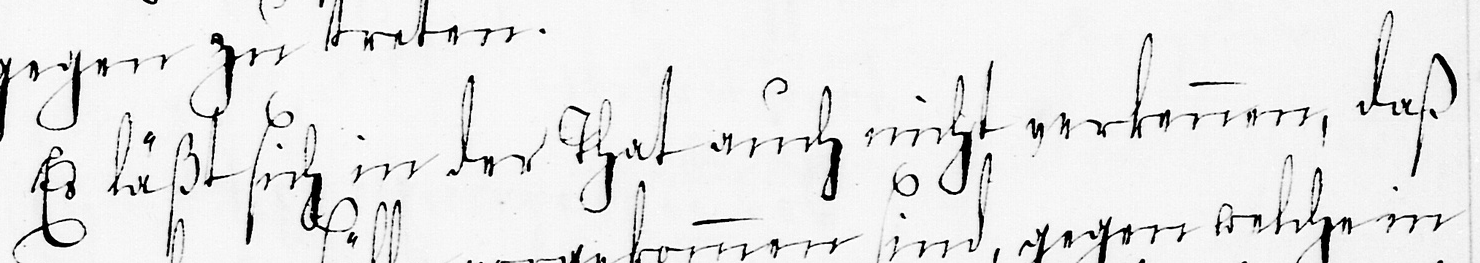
Es läßt sich in der That auch nicht erkennen, daß
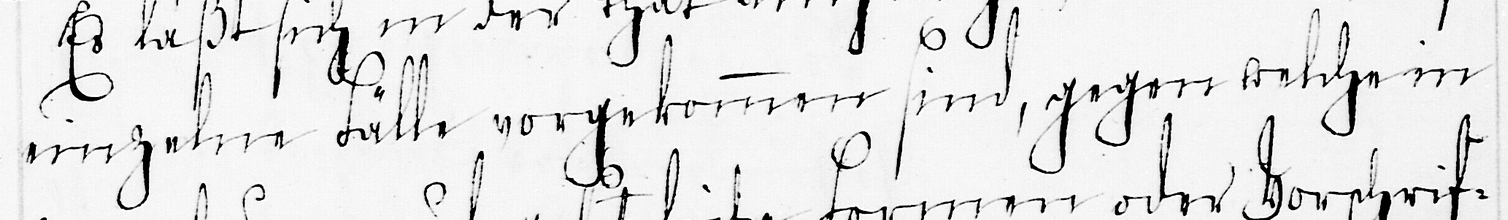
einzelne Fälle vorgekommen sind, gegen welche in
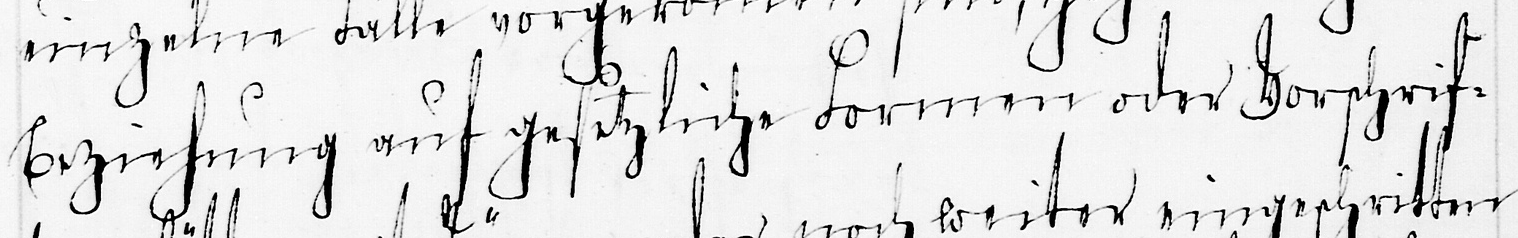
Beziehung auf gesetzliche Formen oder Vorschrif¬
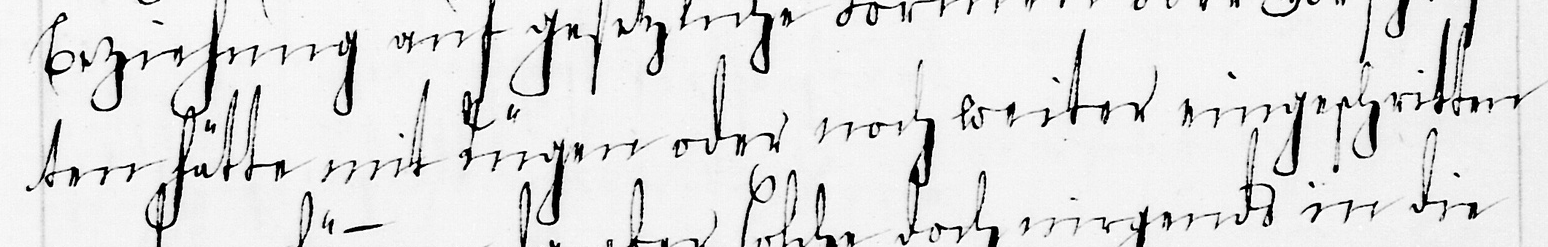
ten hätte mit Rügen oder noch weiter eingeschritten
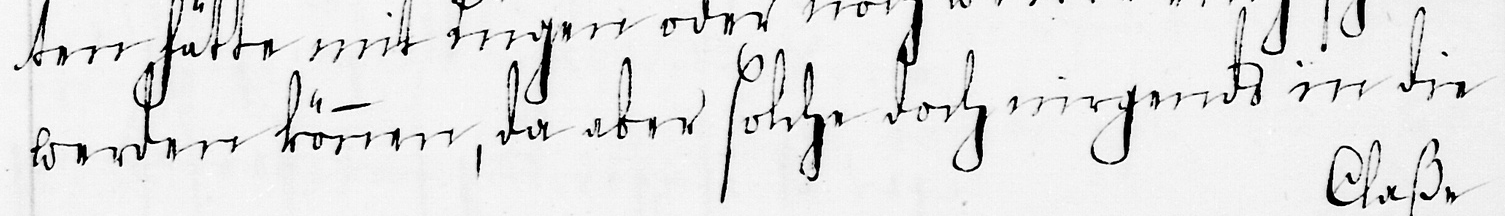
werden können, da aber solche doch nirgends in die
